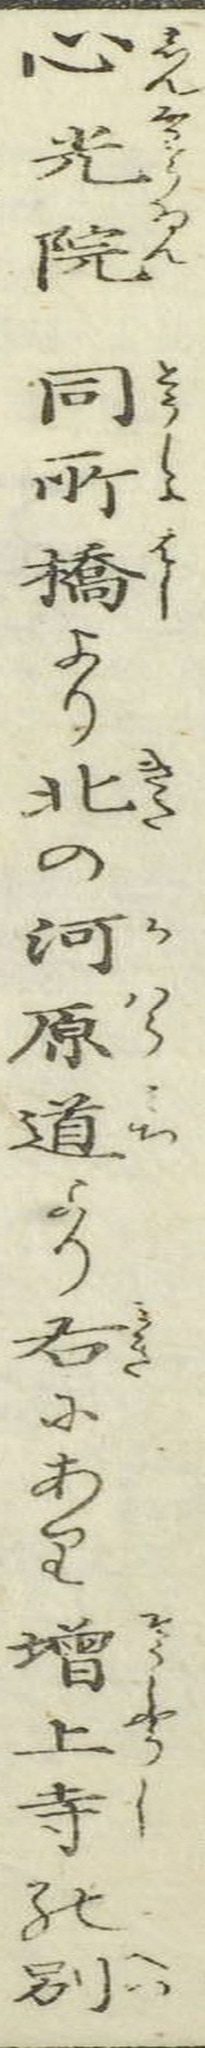心光院同所橋より北の河原道より右にあり増上寺の別
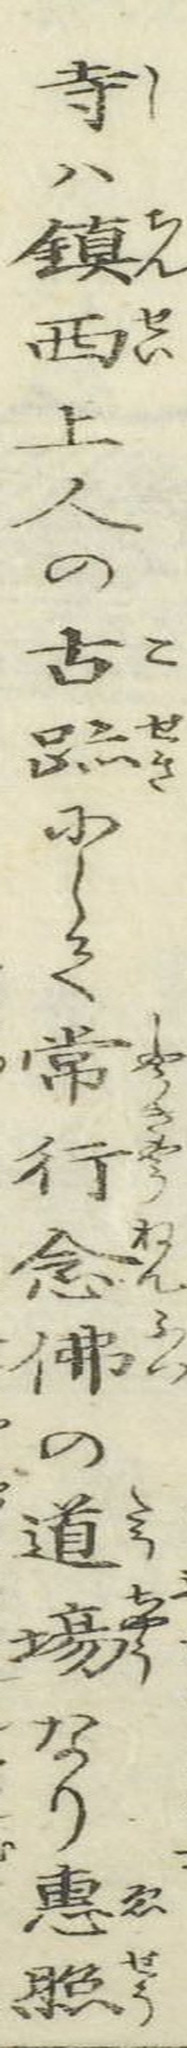寺は鎮西上人の古跡にして常行念佛の道場なり惠照
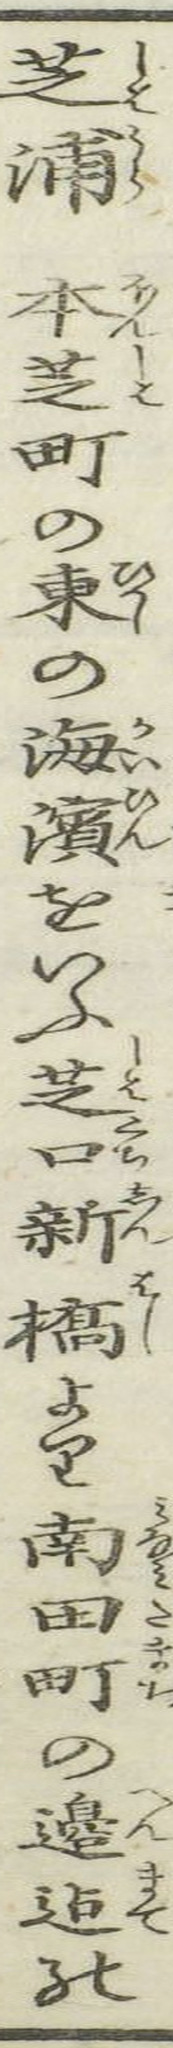芝浦本芝町の東の海濱をいふ芝口新橋より南田町の邊迄の
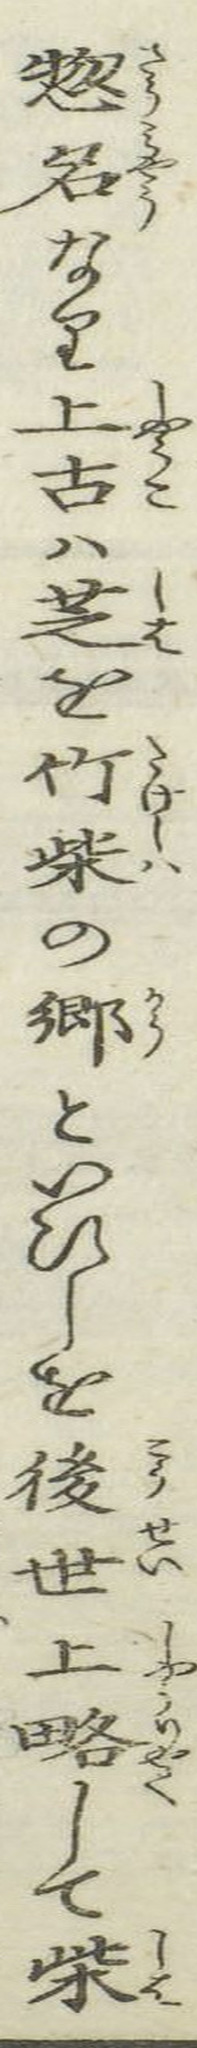惣名なり上古は芝を竹柴の郷といひしを後世上略して柴
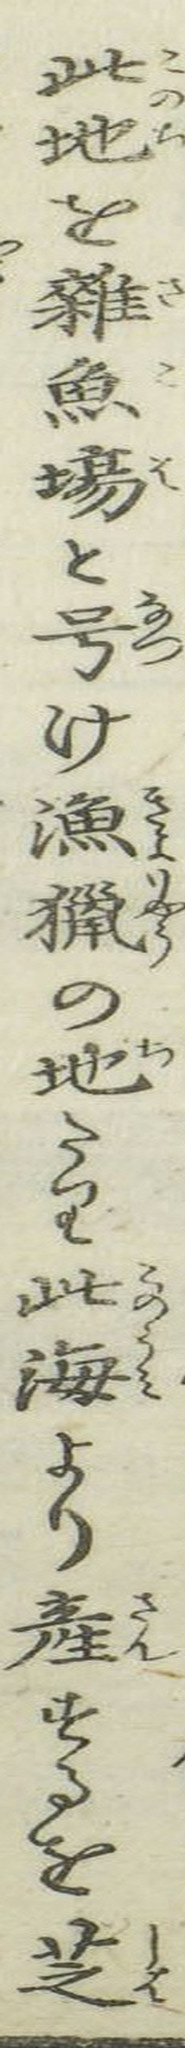此地を雑魚場と号け漁猟の地たり此海より産するを芝
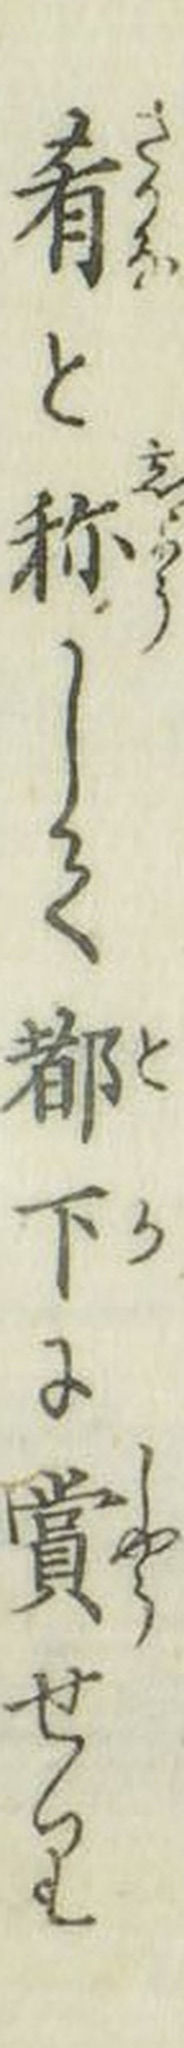肴と称して都下に賞せり

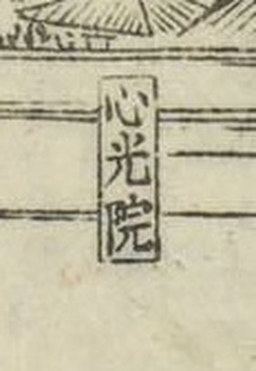心光院
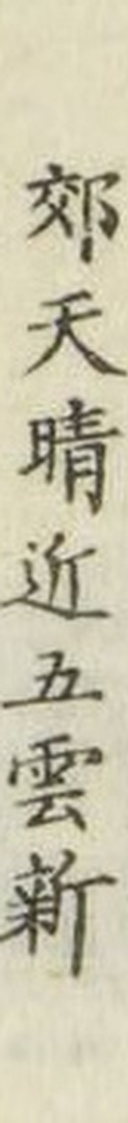郊天晴近五雲新
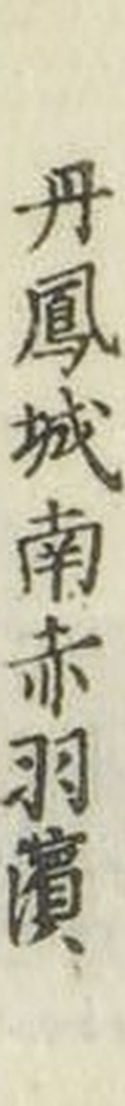丹鳳城南赤羽濵
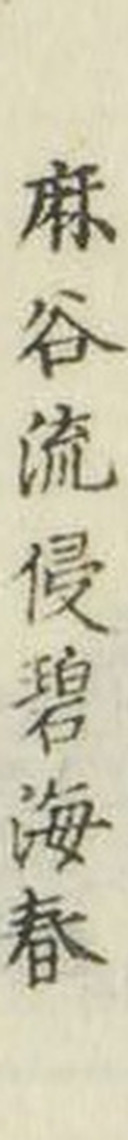麻谷流侵碧海春
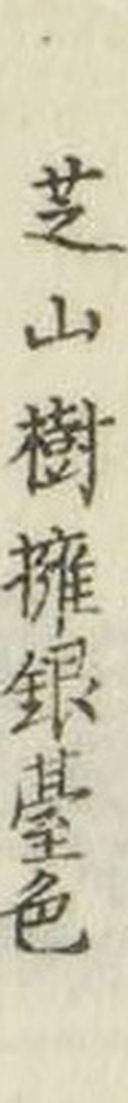芝山樹擁銀臺色
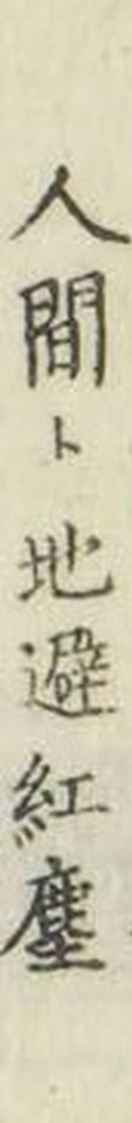人間ト地避紅塵
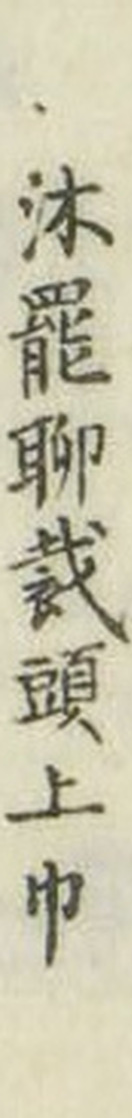沐罷聊裁頭上巾
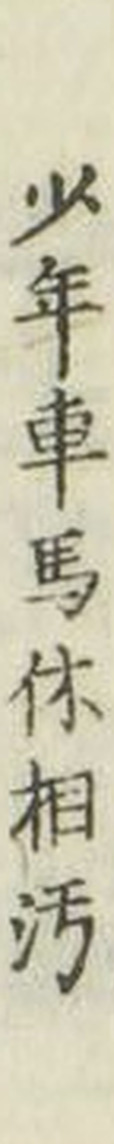少年車馬休相汚
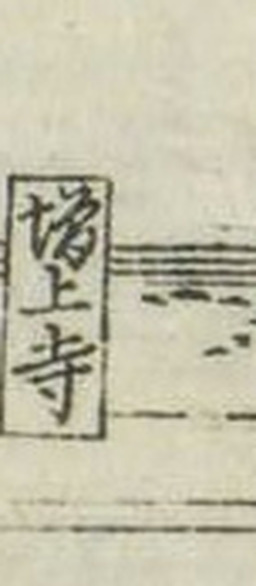増上寺

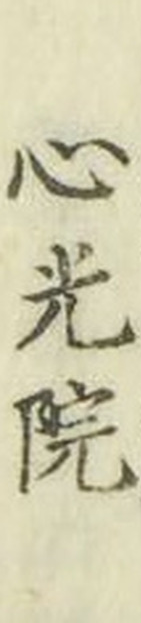心光院
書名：江戸名所図会 20巻 巻之3
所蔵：東京学芸大学教育コンテンツアーカイブ
